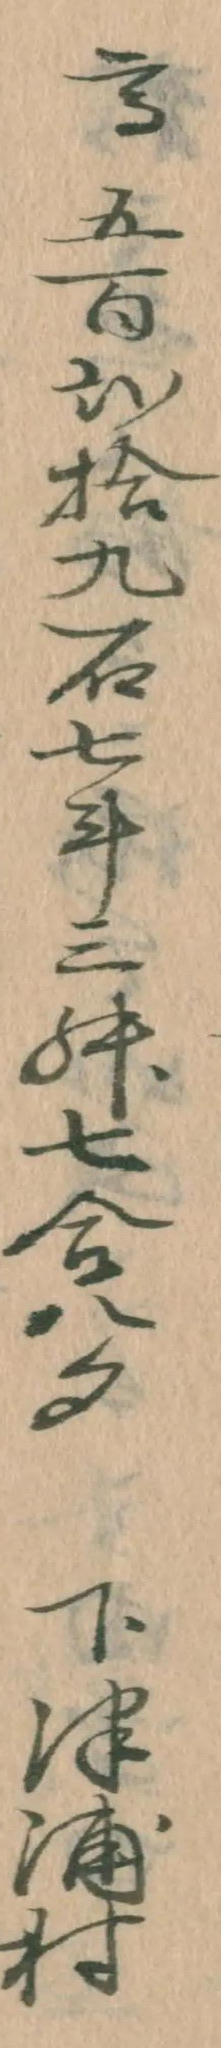高五百弐拾九石七斗三升七合八勺下津浦村
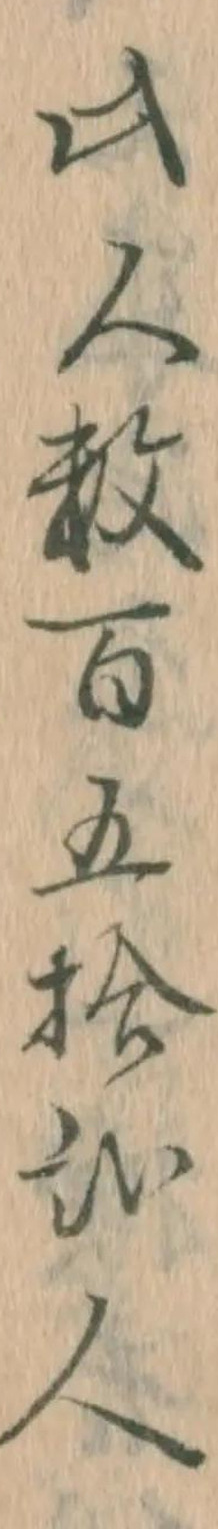此人数百五拾弐人
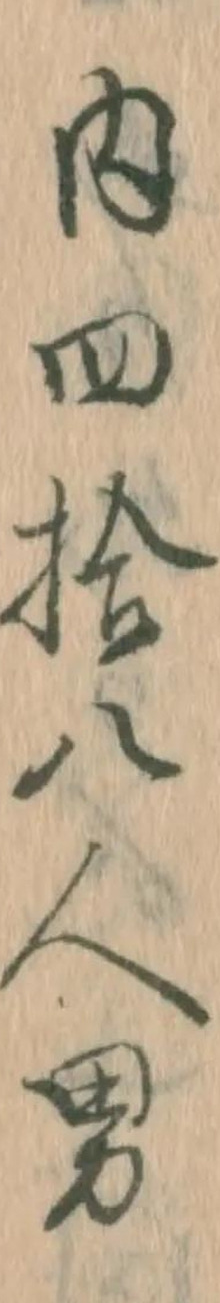内四拾八人男
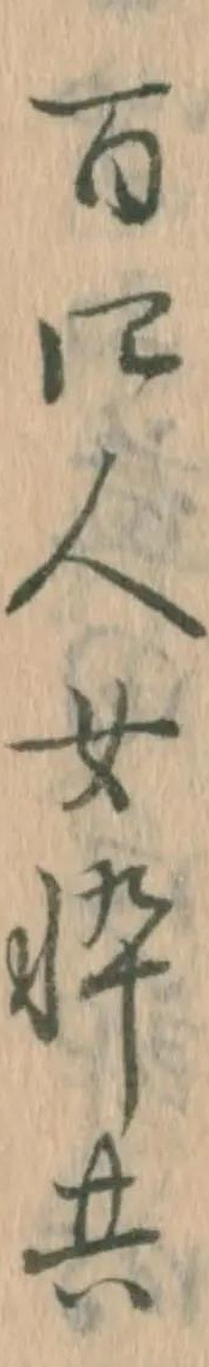百四人女忰共
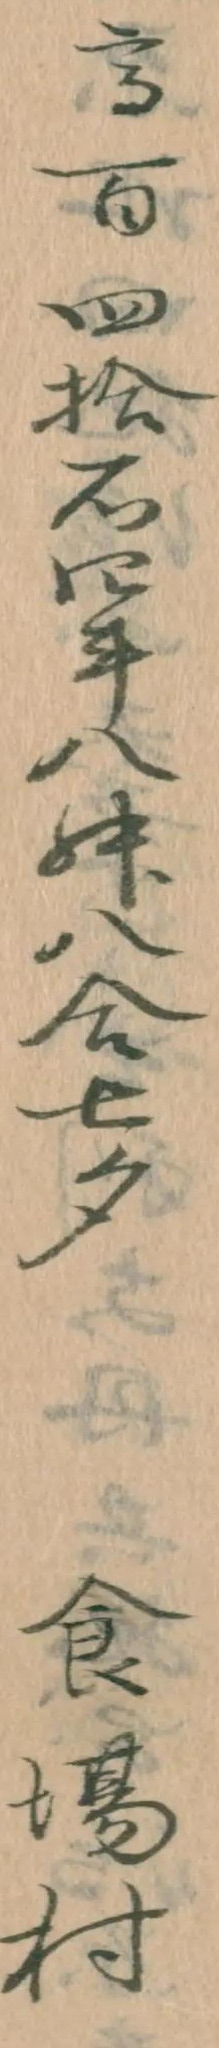高百四拾石四斗八升八合七勺食場村
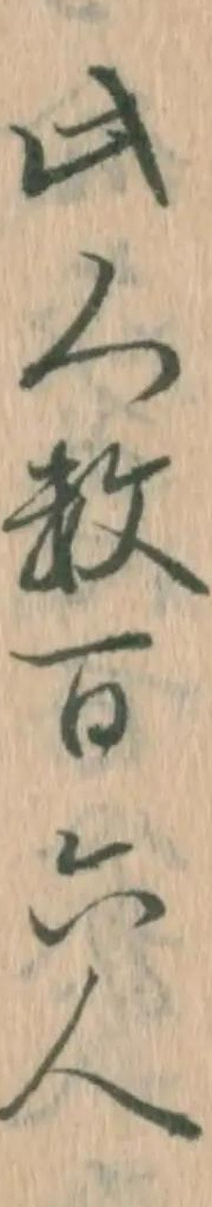此人数百六人
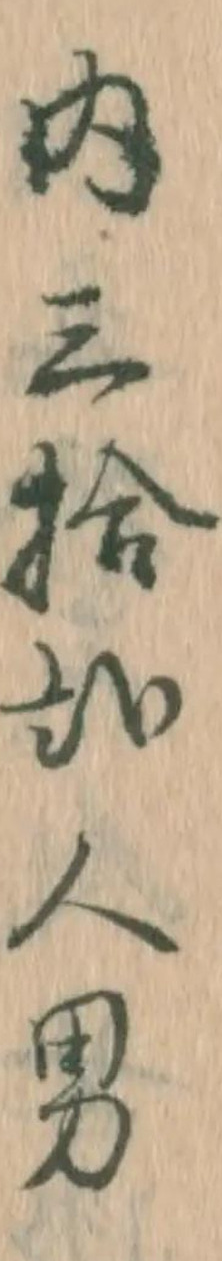内三拾弐人男
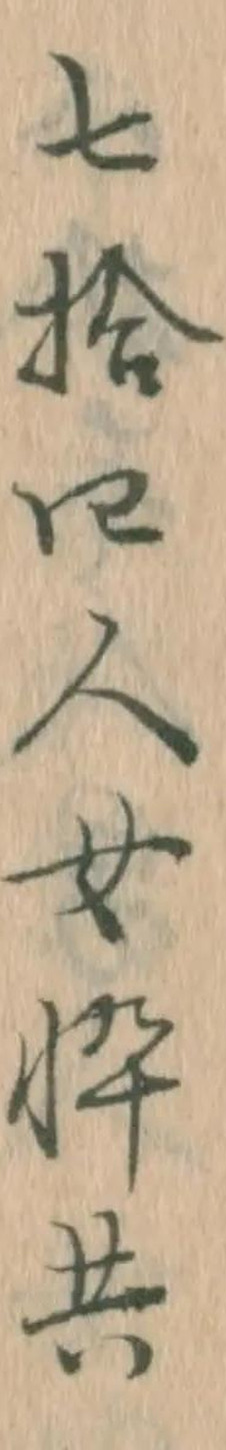七拾四人女忰共
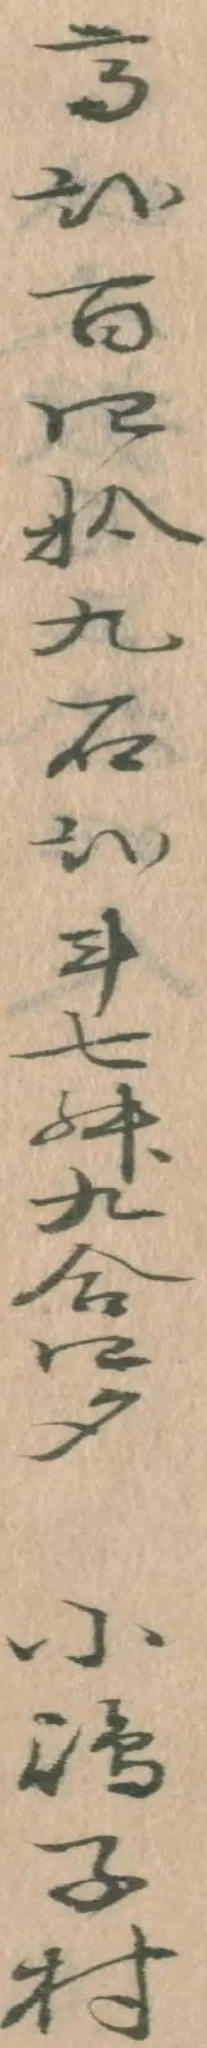高弐百四拾九石弐斗七升九合四勺小島子村
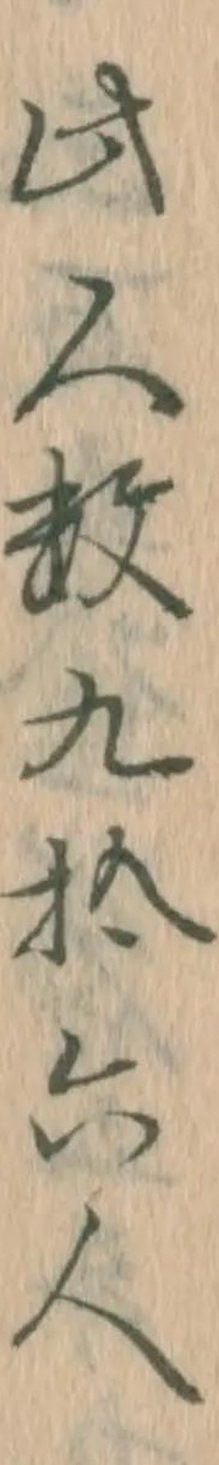此人数九拾六人
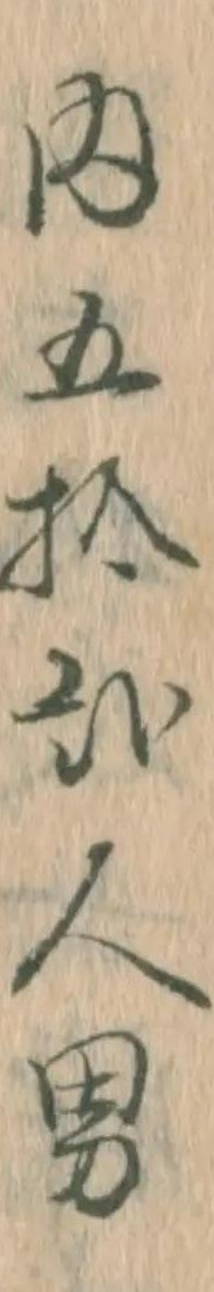内五拾弐人男
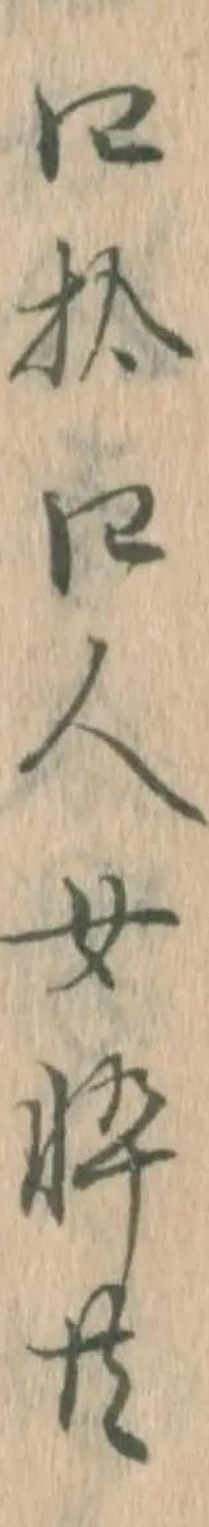四拾四人女忰共
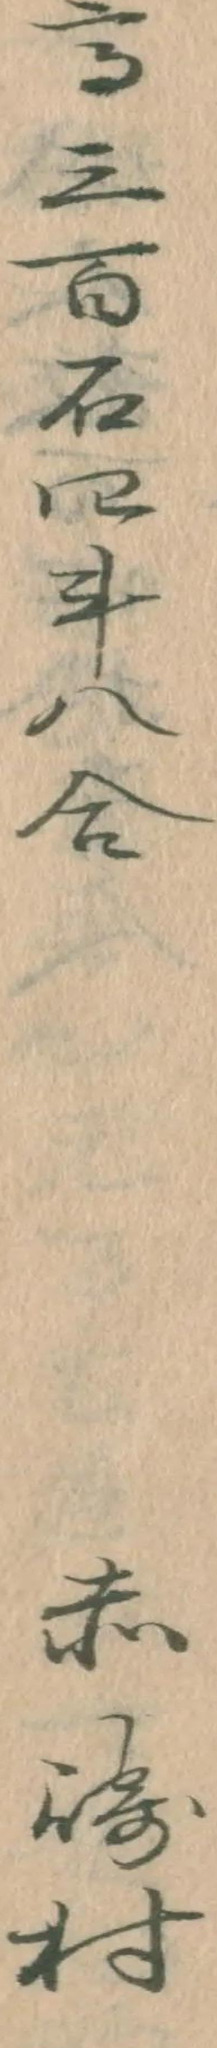高三百石四斗八合赤崎村
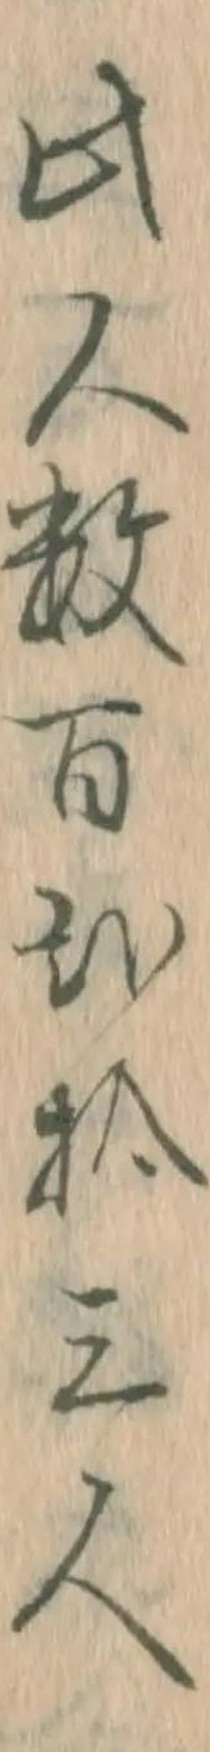此人数百弐拾三人
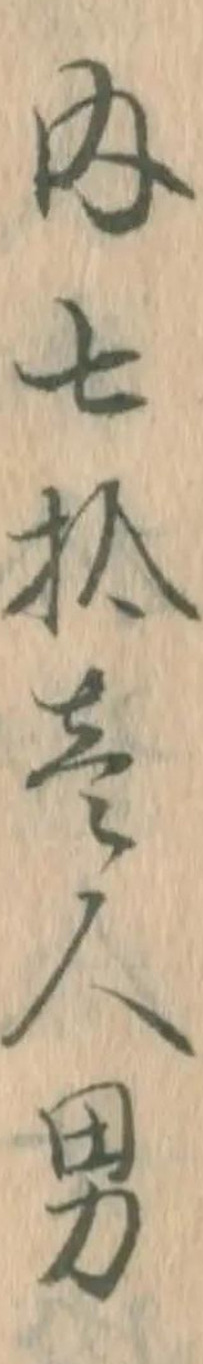内七拾壱人男

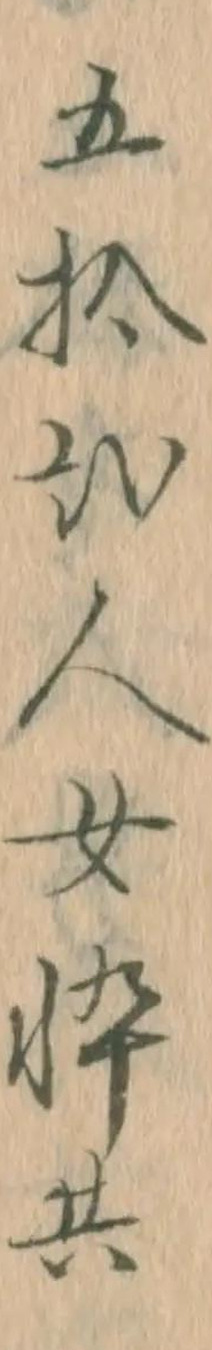五拾弐人女忰共
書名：切支丹御退治記 49巻. [1]
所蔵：国立国会図書館 National Diet Library, JAPAN
